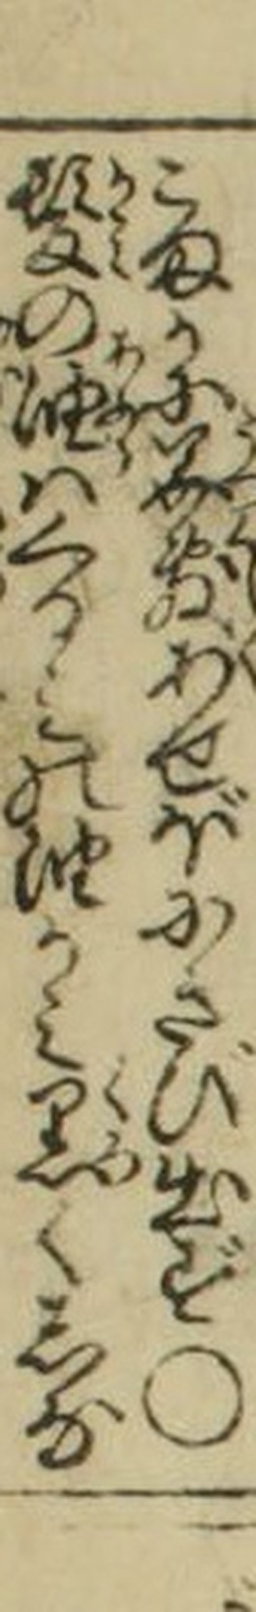髪の油はくるみの油かみ黒くしな
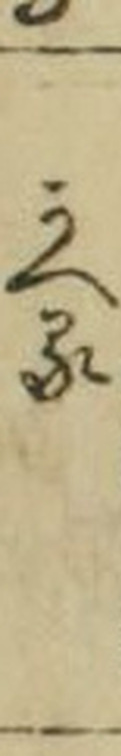かへる
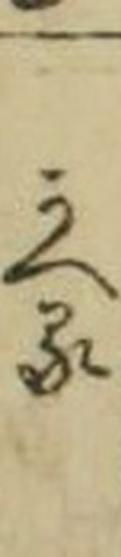かへる
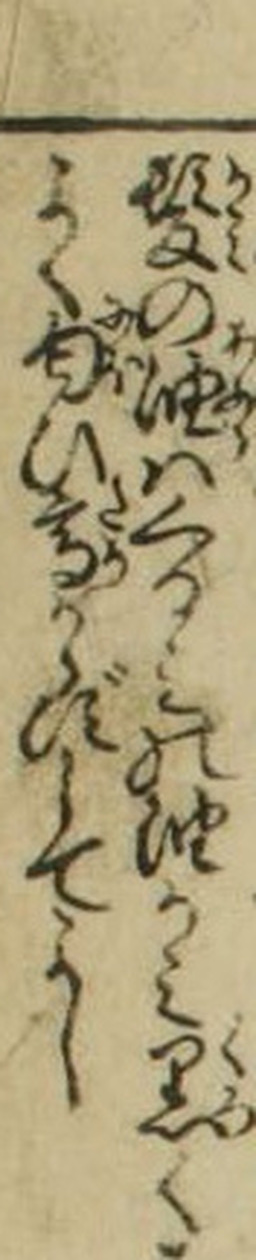よく匂ひ高からずしてよし
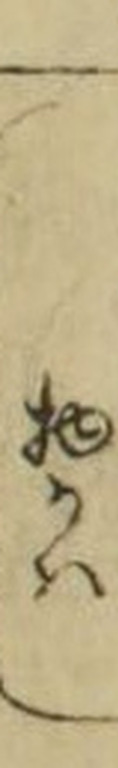物かは
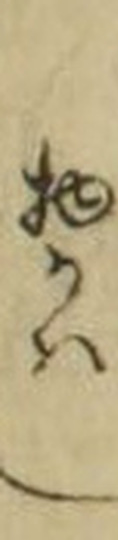物かは

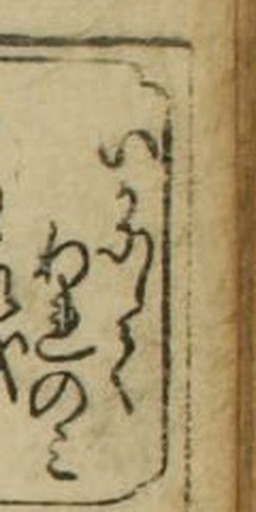いかにして
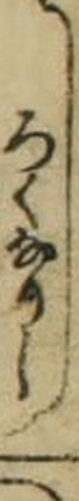ろくなりし
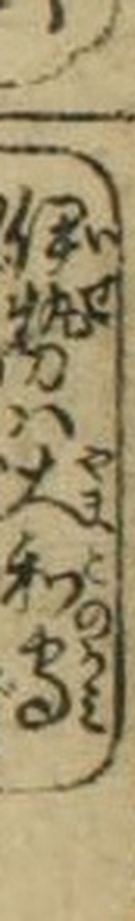伊勢は大和守
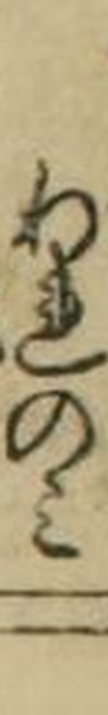われのみ
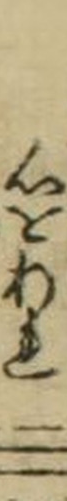心をわれ
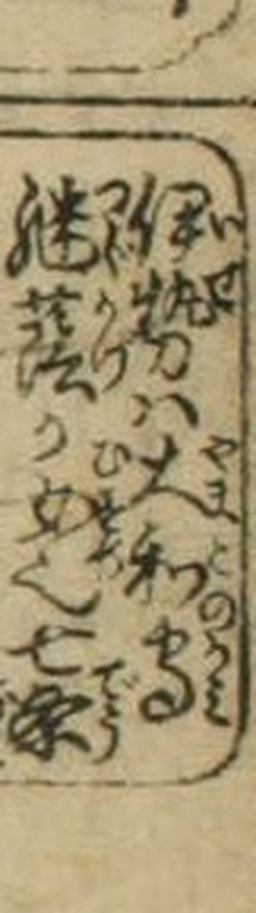継蔭か女也七条
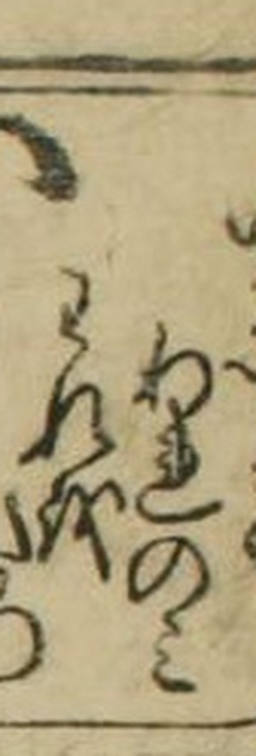われを
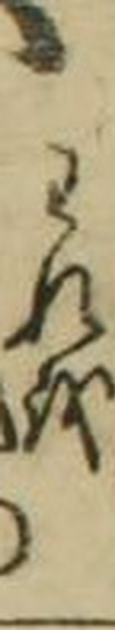われを
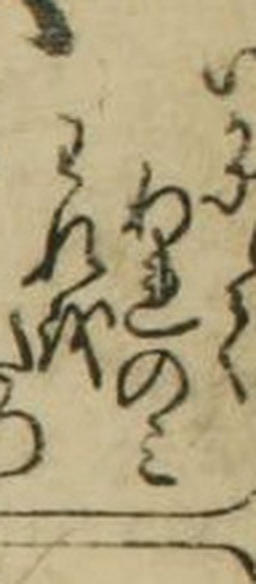われを
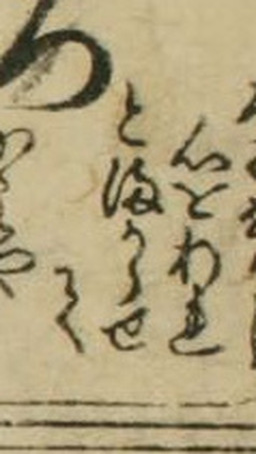とまからせ
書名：女源氏教訓鑑
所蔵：東京学芸大学附属図書館
